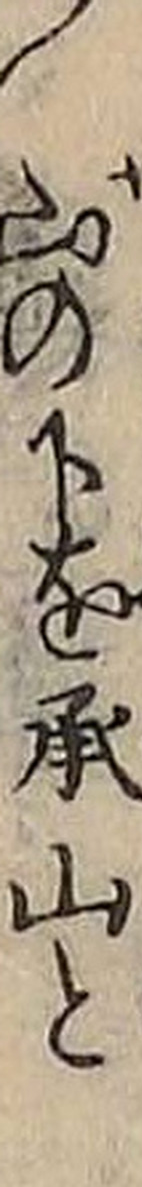山の下を承山と
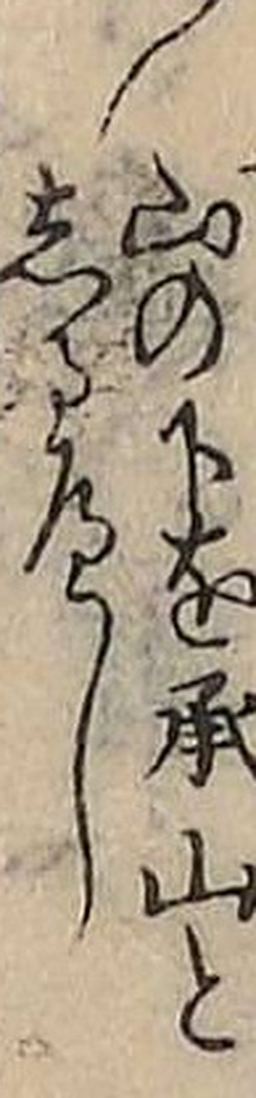しるへし
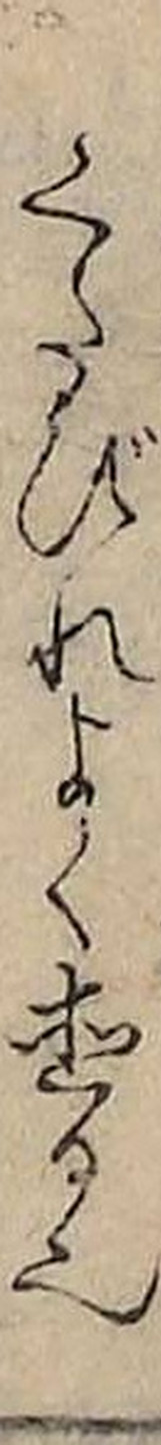くたびれよく直る也
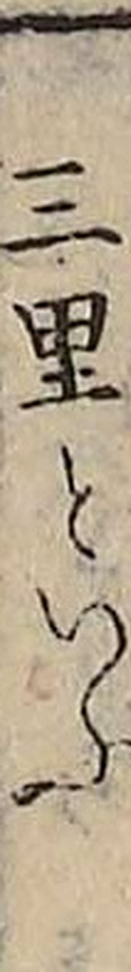三里といふ

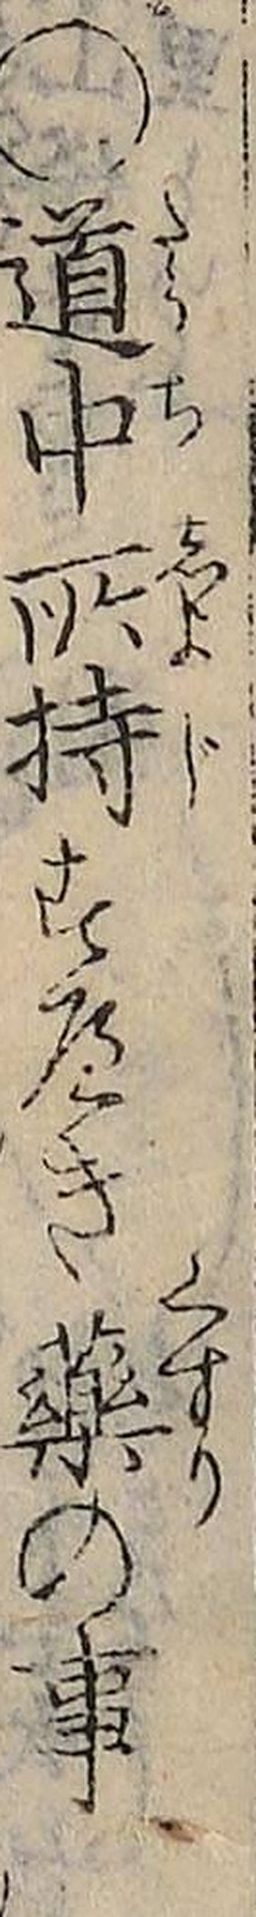○道中所持すへき薬の事
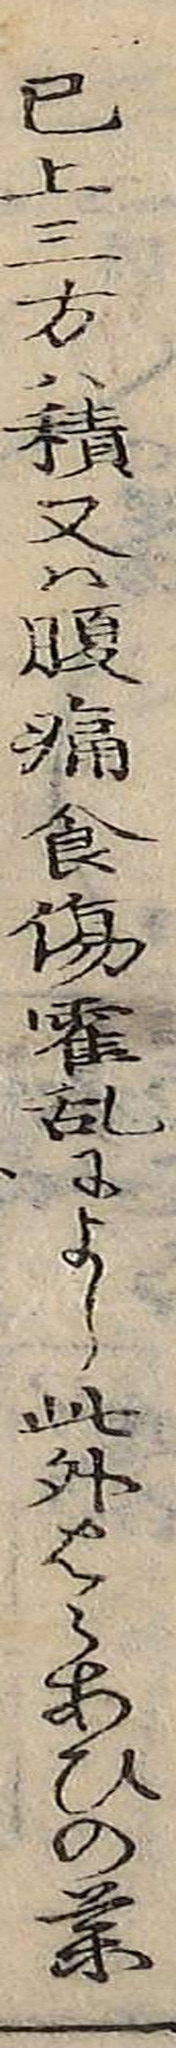已上三方は積又は腹痛食傷霍乱によし此外はらあひの薬
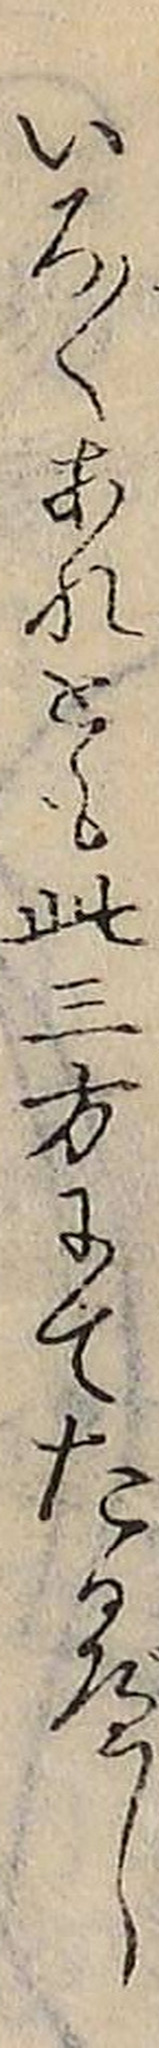いろ〳〵あれとも此三方にてたるべし
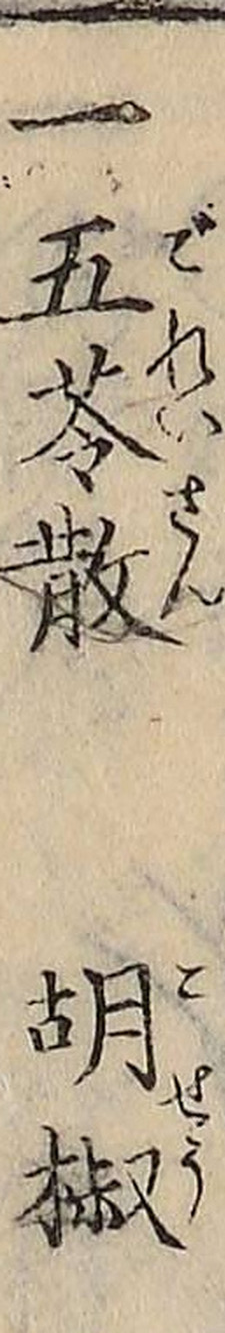一五苓散胡椒
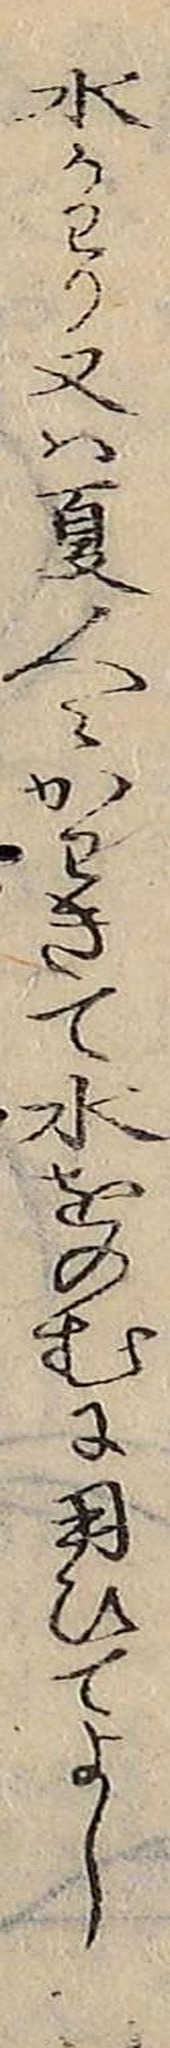水かわり又は夏人々かわきて水をのむに用ひてよし
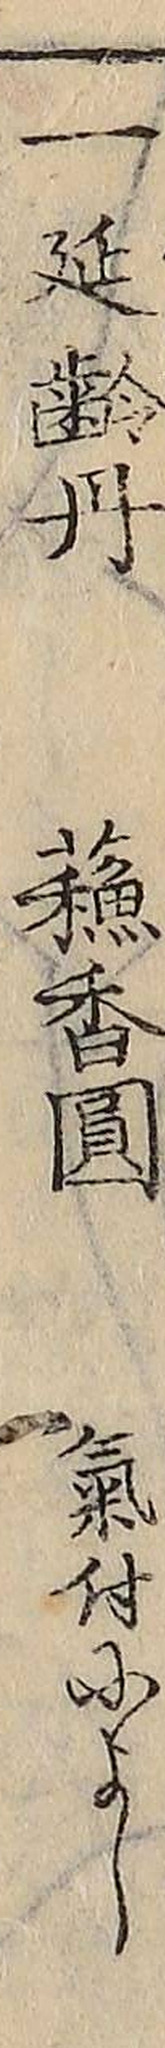一延齢丹蘇香円気付によし
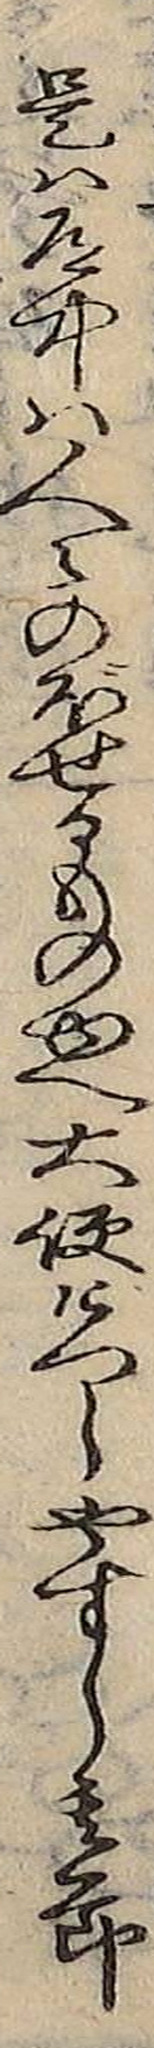是は道中は人々のぼせるものゆへ大便けつしやすし其節
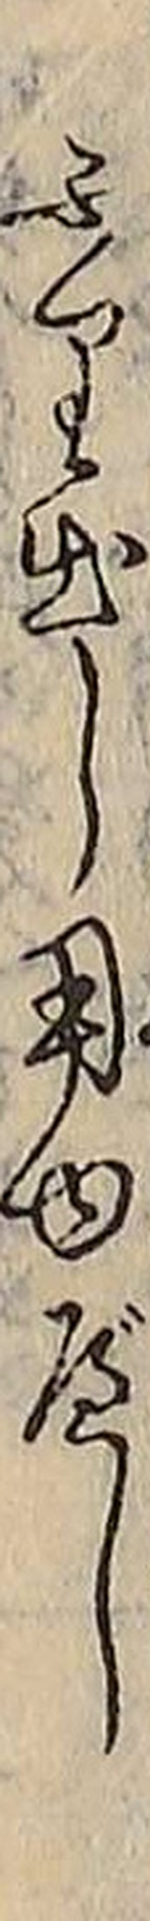ふり出し用ゆべし
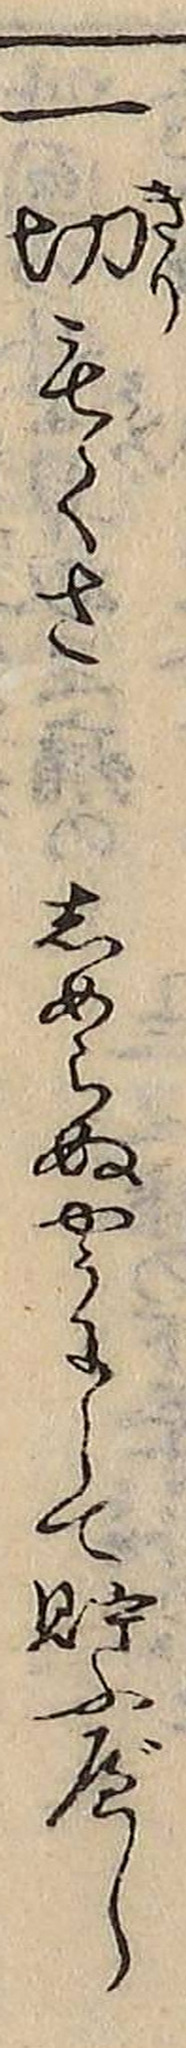一切もくさしめらぬやうにして貯ふべし
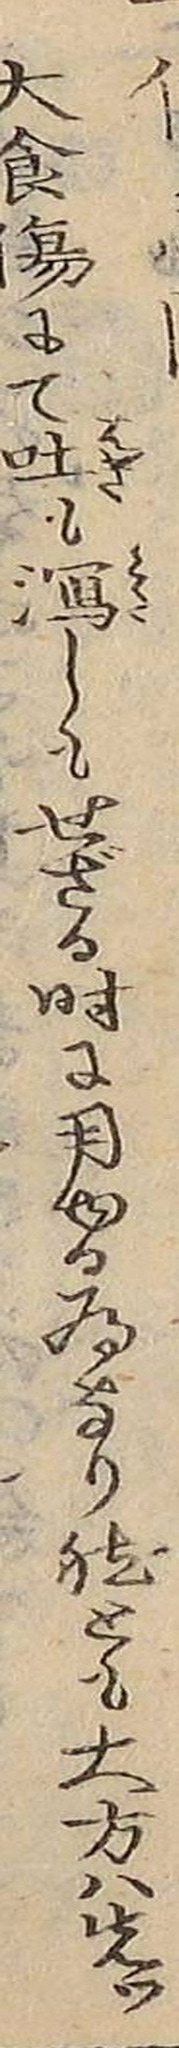大食傷にて吐も瀉しもせざる時に用ゆる為なり然とも大方は先つ
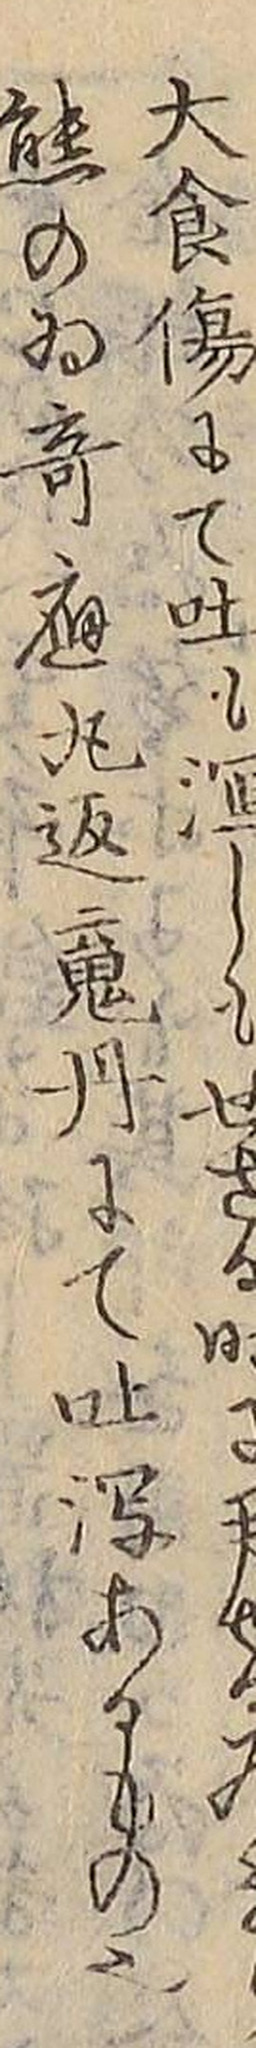熊のゐ奇応丸返魂丹にて吐瀉あるもの也
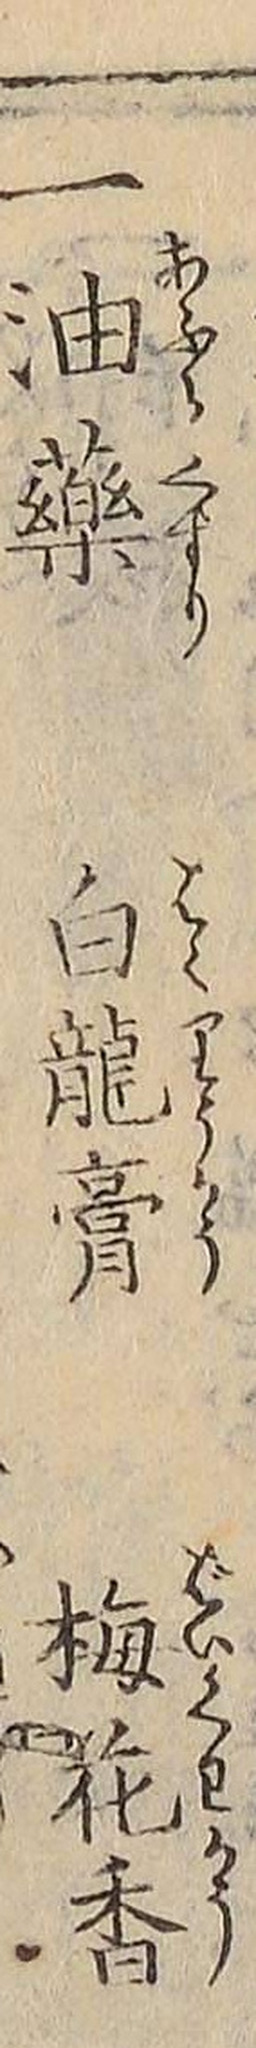一油薬白竜膏梅花香
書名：旅行用心集
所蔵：神戸大学附属図書館 国文学研究資料館
